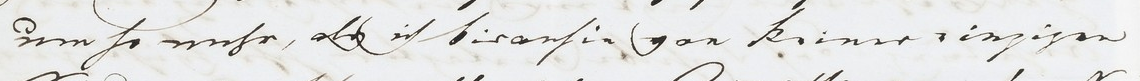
um so mehr, als ich bisanhin von keiner einzigen
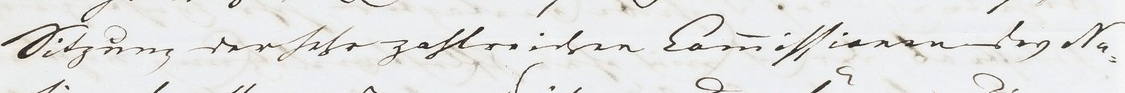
Sitzung der sehr zahlreichen Commissionen des Na-
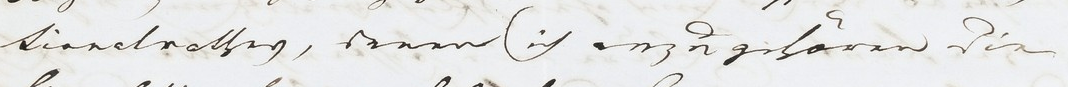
tionalrathes, denen ich anzugehören die
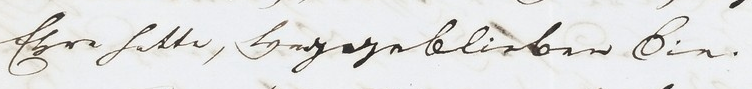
Ehre hatte, weggeblieben bin.
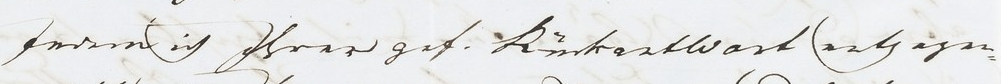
Indem ich Ihrer gef. Rückantwort entgegen-
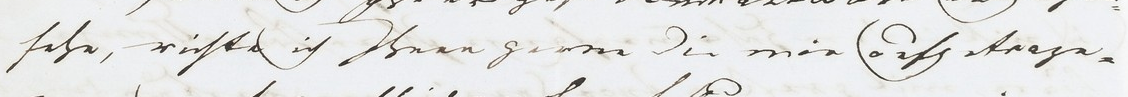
sehe, richte ich Ihnen gerne die mir aufgetrage-
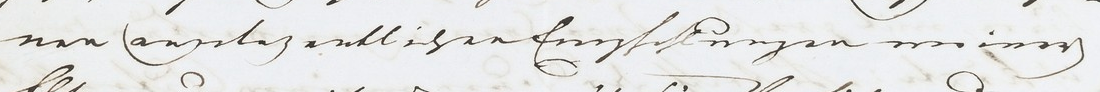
nen angelegentlichen Empfehlungen meiner
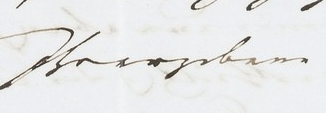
Ihr ergebener
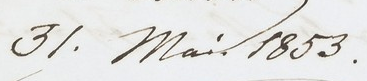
31. Mai 1853.
